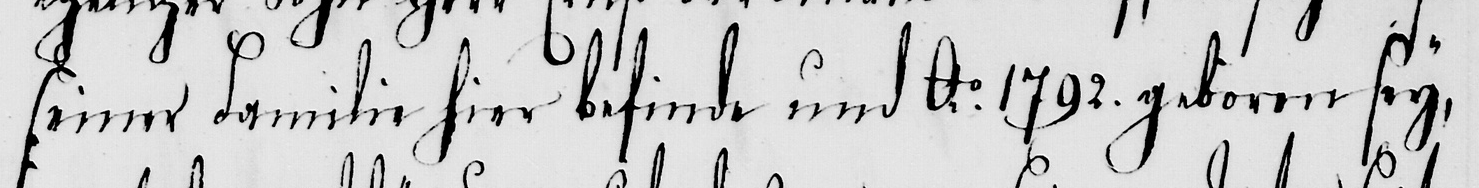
seiner Familie hier befinde und Ao. 1792. geboren sey,
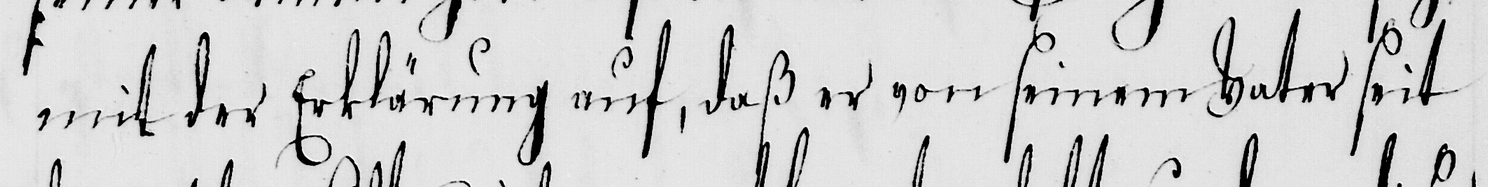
mit der Erklärung auf, daß er von seinem Vater seit
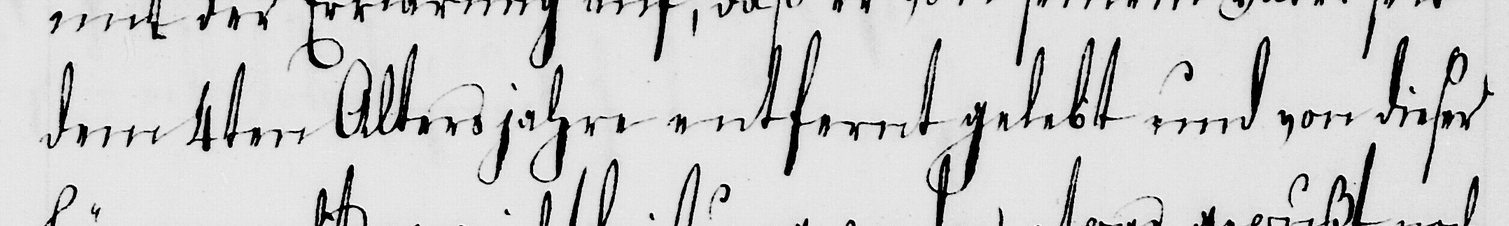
dem 4ten Altersjahre entfernt gelebt und von dieser
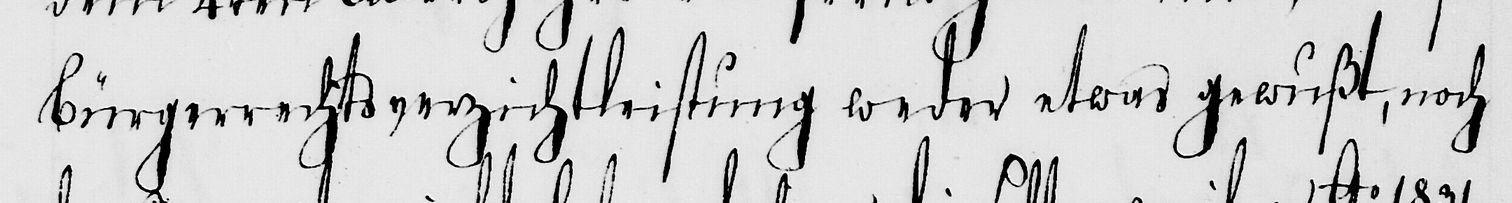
Bürgerrechtsverzichtleistung weder etwas gewußt, noch
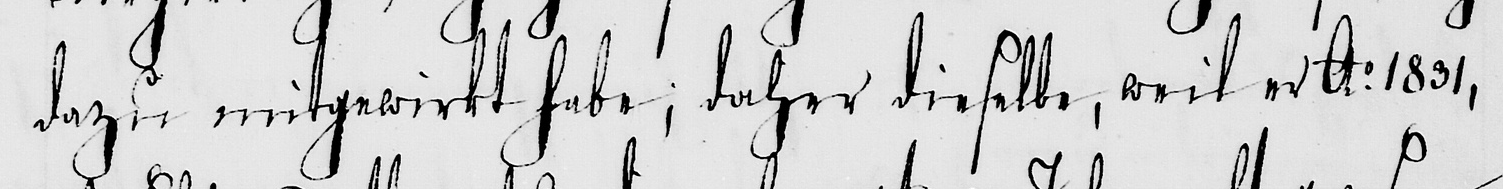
dazu mitgewirkt habe; daher dieselbe, weil er Ao. 1831,
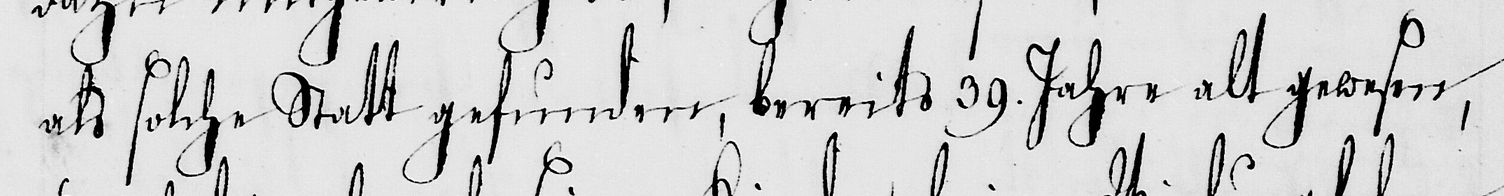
als solche Statt gefunden, bereits 39. Jahre alt gewesen,
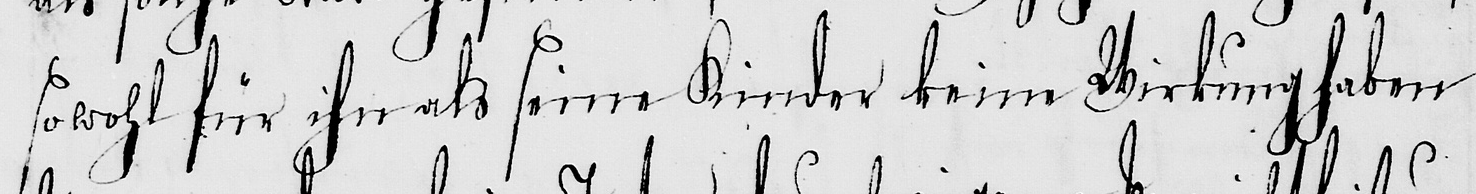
sowohl für ihn als seine Kinder keine Wirkung haben
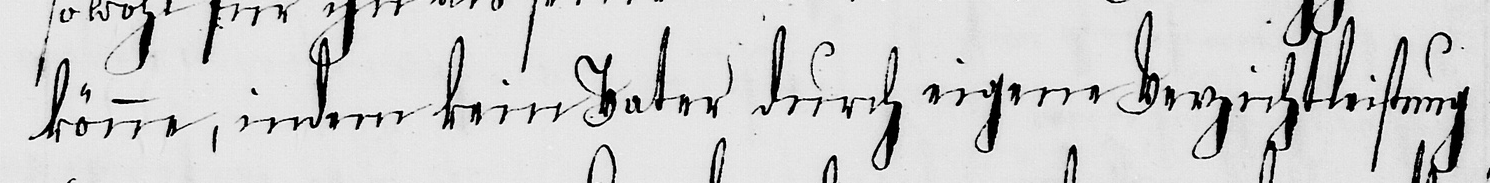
könne, indem kein Vater durch eigene Verzichtleistung
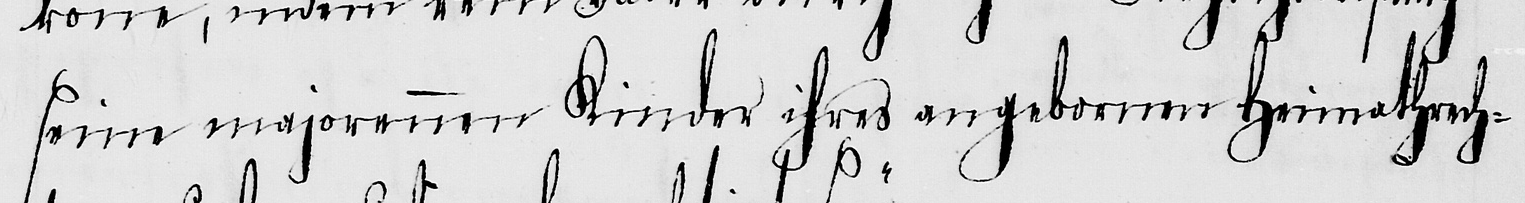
seine majorennen Kinder ihres angebornen Heimathrech¬
